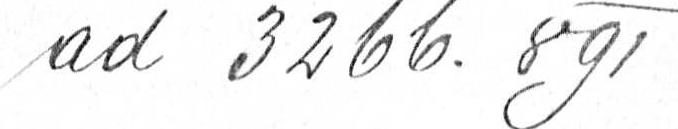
ad 3266 1891
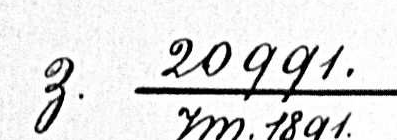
Z. 20991/
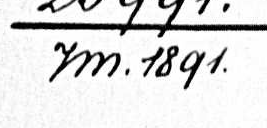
IM 1891
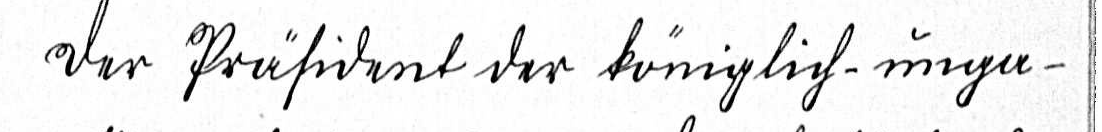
Der Präsident der königlich-unga¬
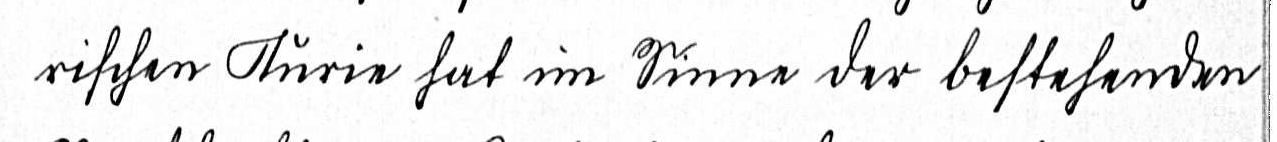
rischen Kurie hat im Sinne der bestelenden
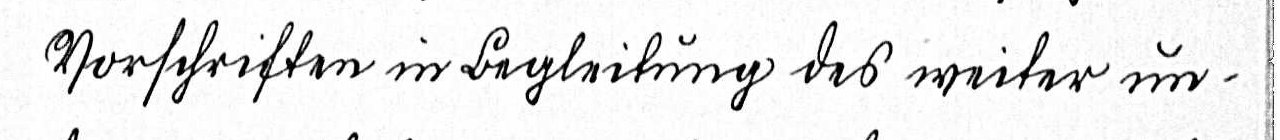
Vorschriften in Begleitung des weiter un¬
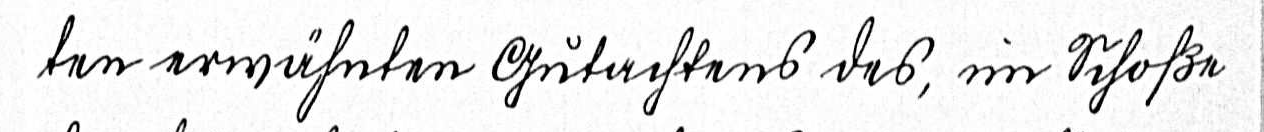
ten erwähnten Gutachtens des, im Schloße
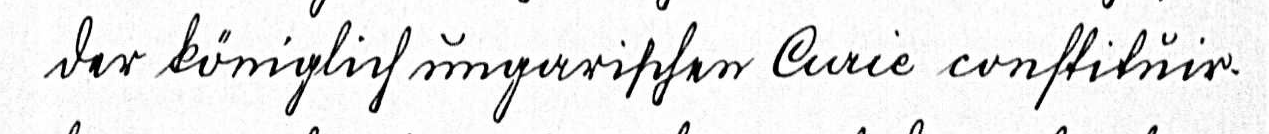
der königlich ungarischen Curie constituir¬
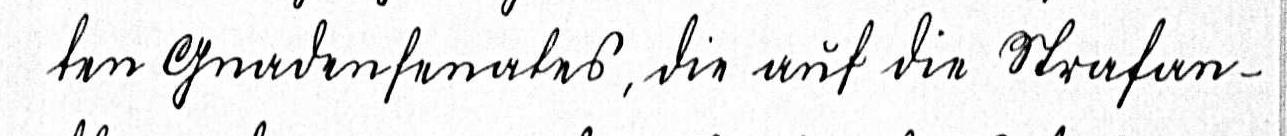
ten Gnadensenates, die auf die Strafan¬
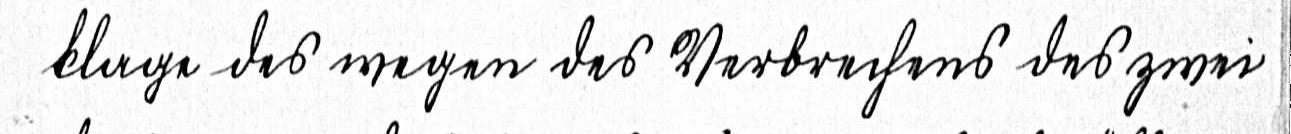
klage des wegen des Verbrechens des zwei¬
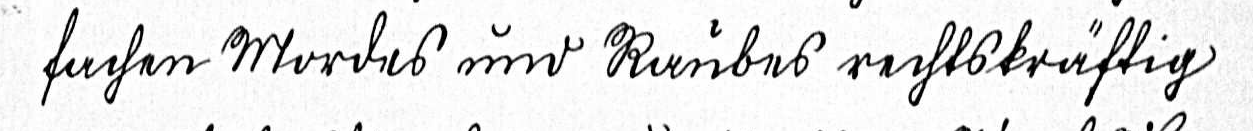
fachen Mordes und Raubes rechtskräftig
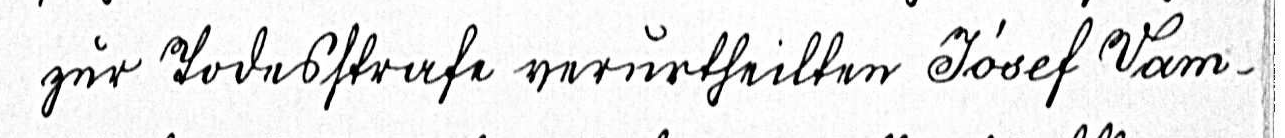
zur Todesstrafe verurtheilen Jósef Vam¬
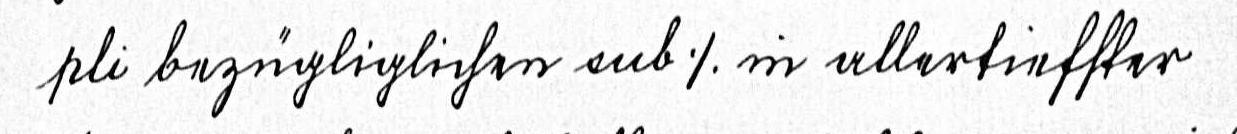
pli bezüglichen sub % in allertiefster
